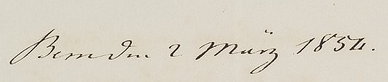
Bern den 2 März 1854.
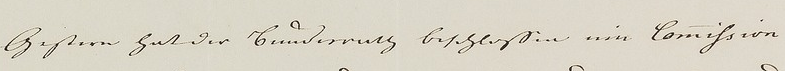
Gestern hat der Bundesrath beschlossen, eine Commission
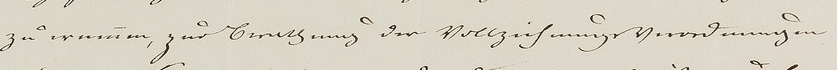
zu ernennen, zur Berathung der Vollziehungs Verordnungen
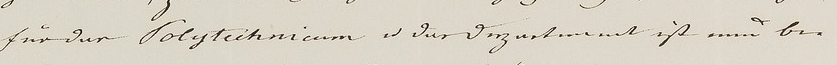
für das Polytechnicum u das Departement ist nun be-
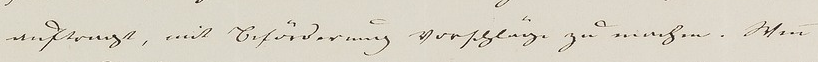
auftragt, mit Beförderung Vorschläge zu machen. Wenn
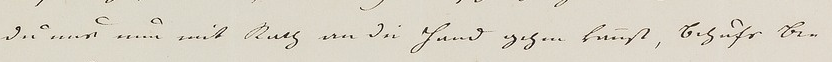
du uns nun mit Rath an die Hand gehen kannst, Behufs Be-
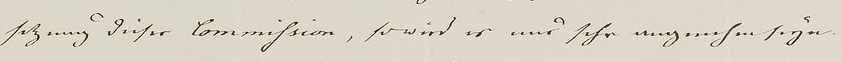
setzung dieser Commission, so wird es uns sehr angenehm seyn.
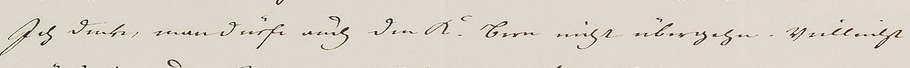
Ich denke, man dürfe auch den K. Bern nicht übergehn. Vielleicht
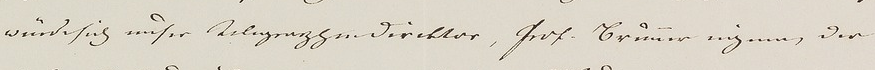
würde sich unser Telegraphen Direktor, Prof. Brunner eignen, der
